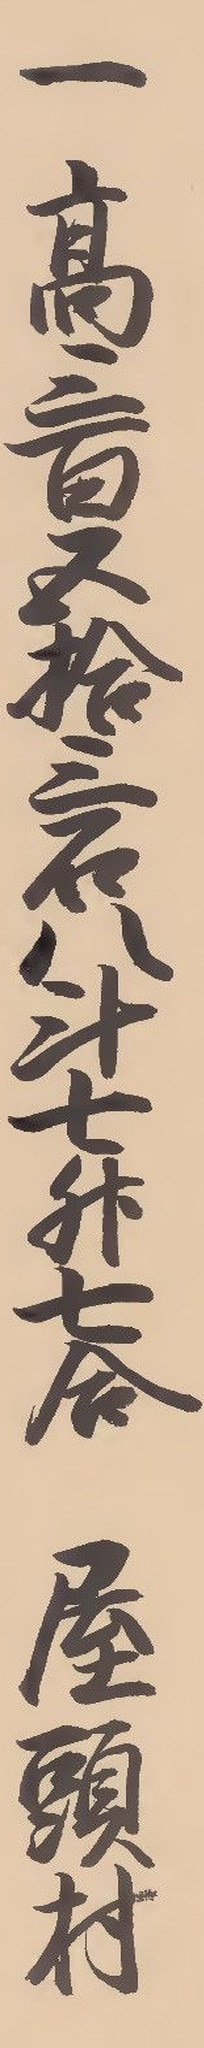一髙三百五拾三石八斗七升七合屋頭村
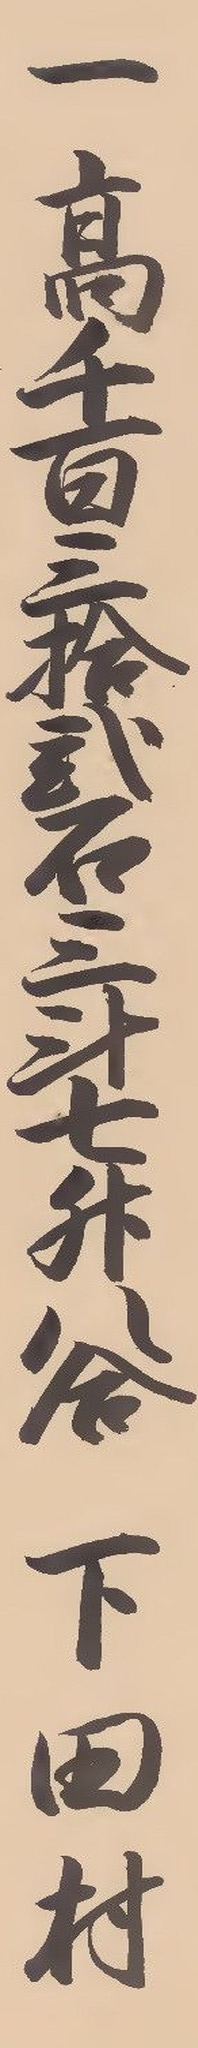一髙千百三拾弐石三斗七升八合下田村

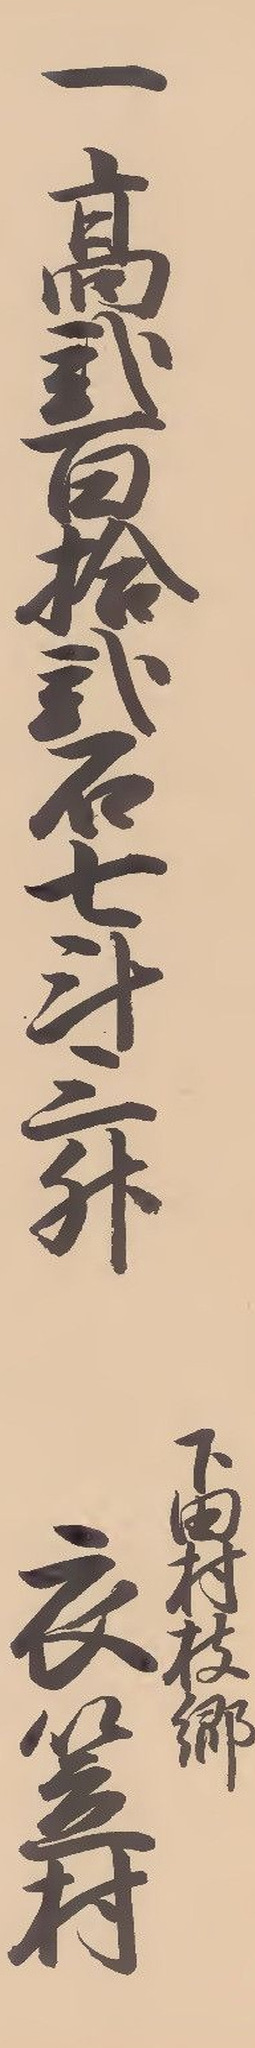一髙弐百拾弐石七斗三升衣笠村
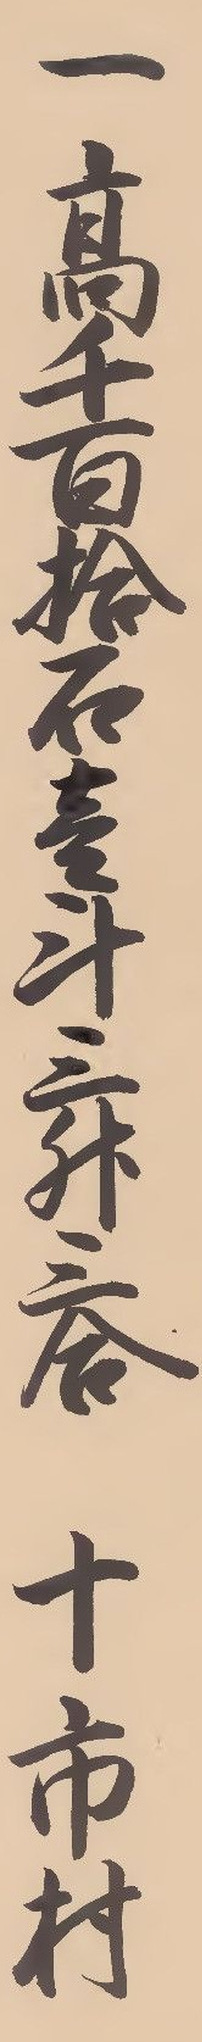一髙千百拾石壱斗三升三合十市村
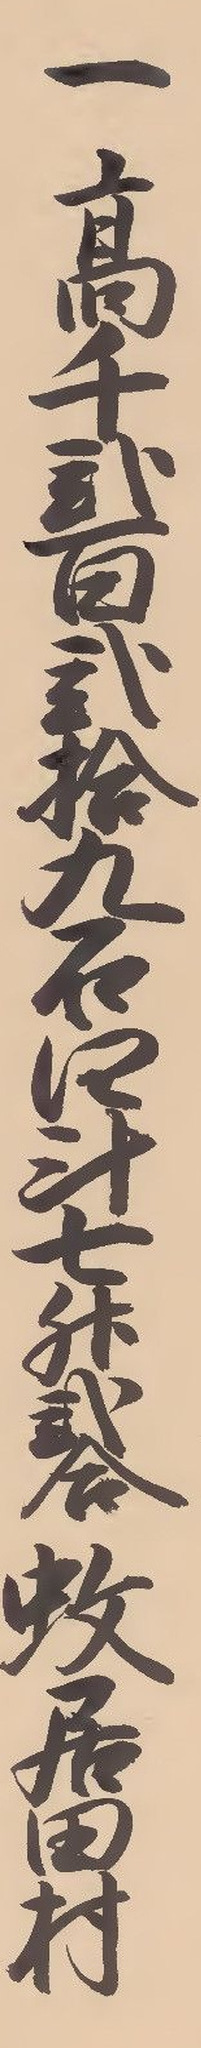一髙千弐百弐拾九石四斗七升弐合蚊居田村
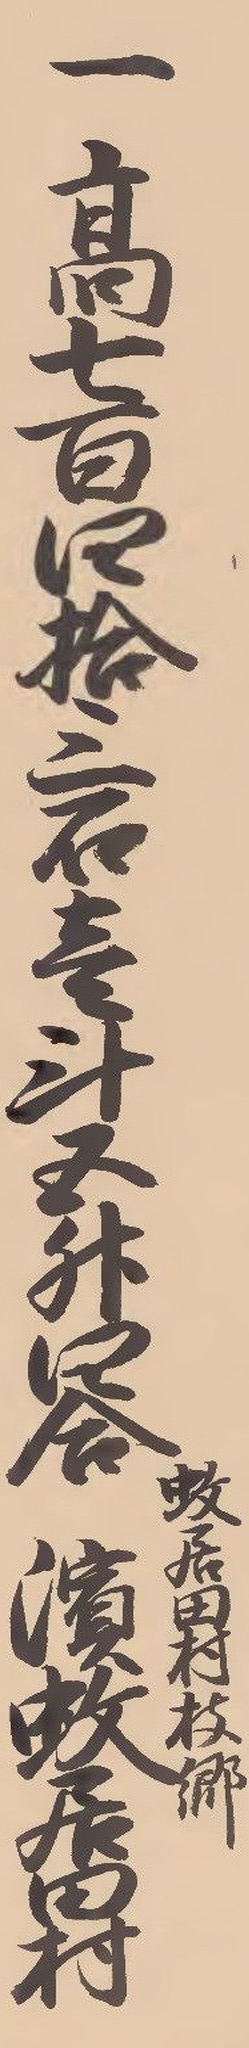一髙七百四合三石壱斗五升四合濱蚊居田村
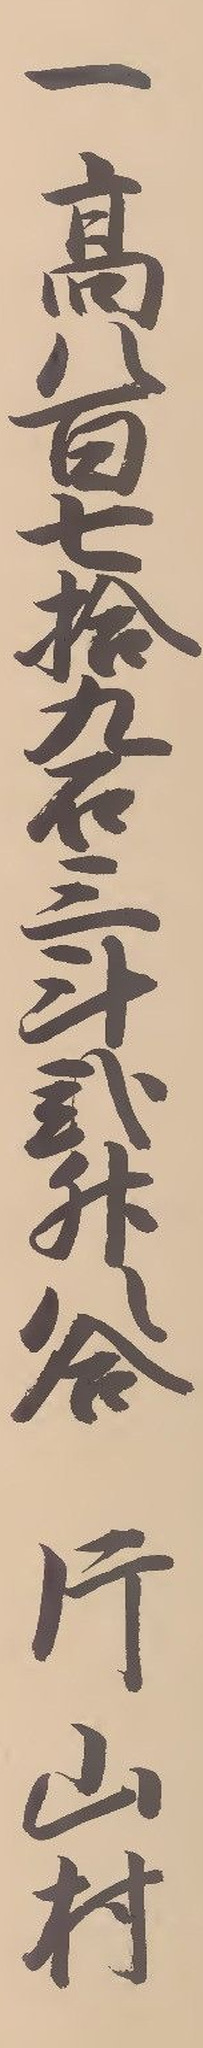一髙八百七拾九石三斗弐升八合片山村
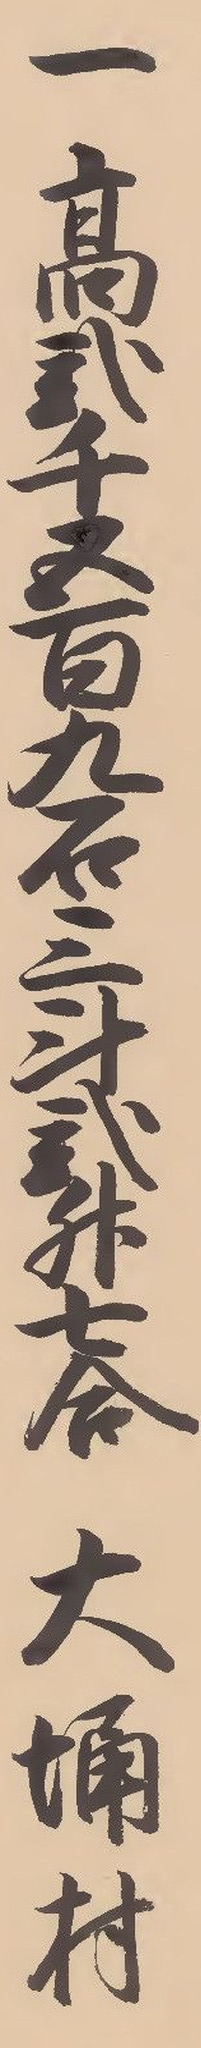一髙弐千五百九石三斗弐升七合大桶村
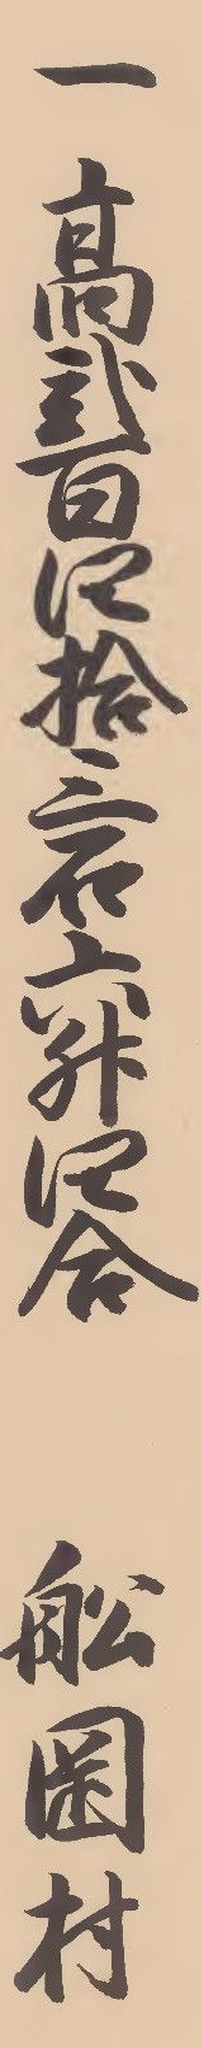一髙弐百四拾三石六升四合舩村
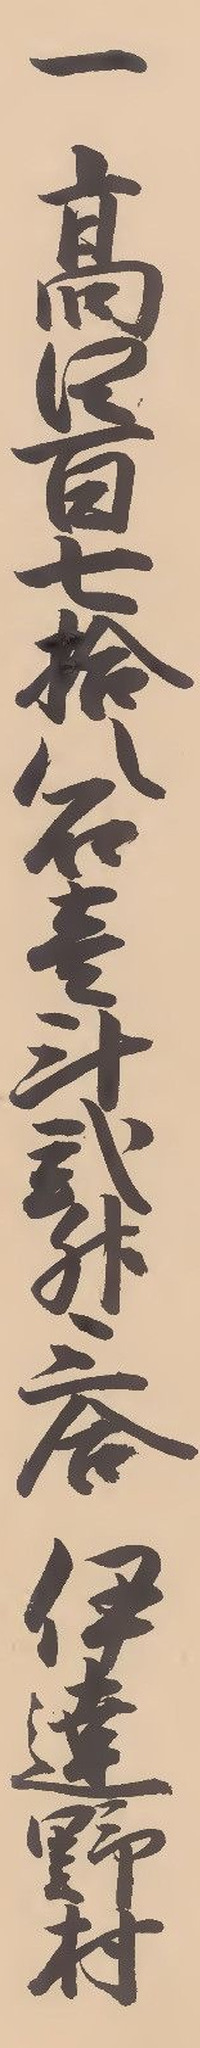一髙四百七拾八石壱斗弐升三合伊達野村

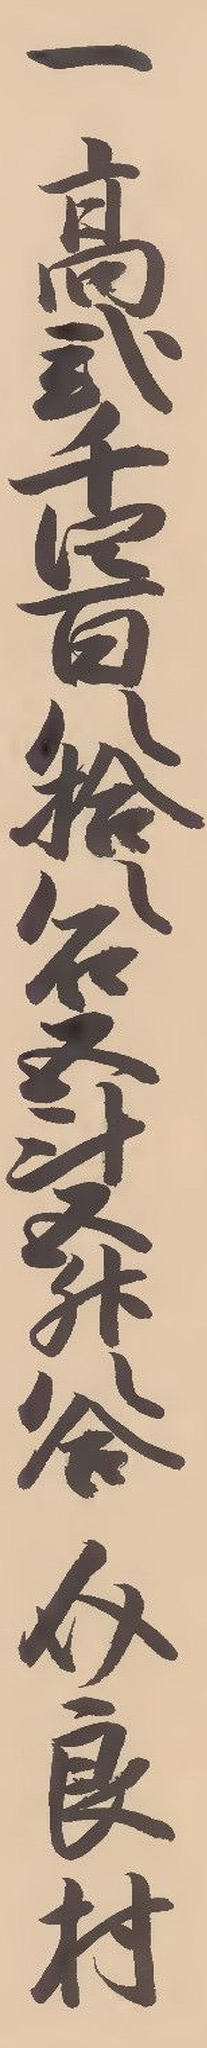一髙弐千四百八拾八石五斗五升八合介良村
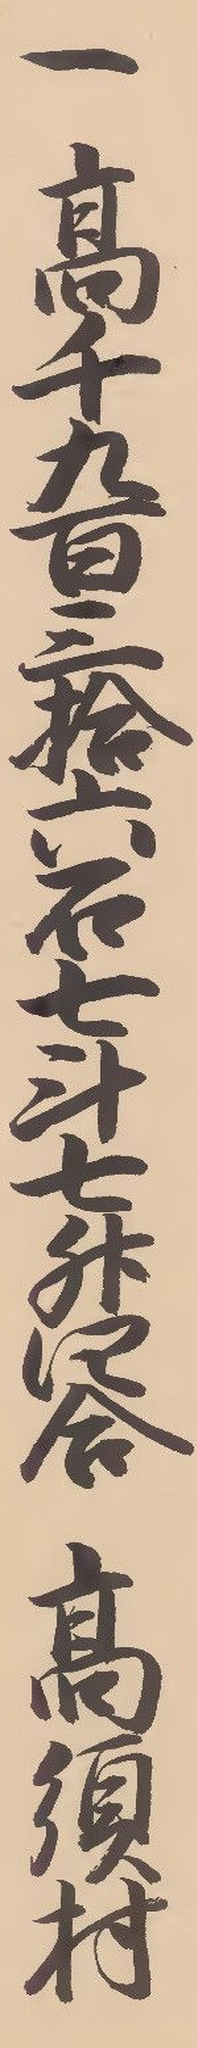一髙千九百三拾六石七斗七升四合高須村
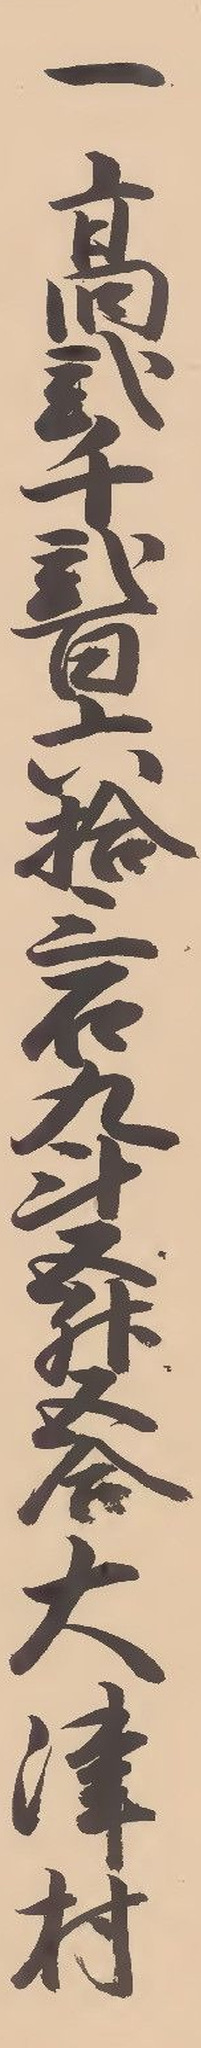一髙弐千弐百六拾三石九斗五升五合大津村
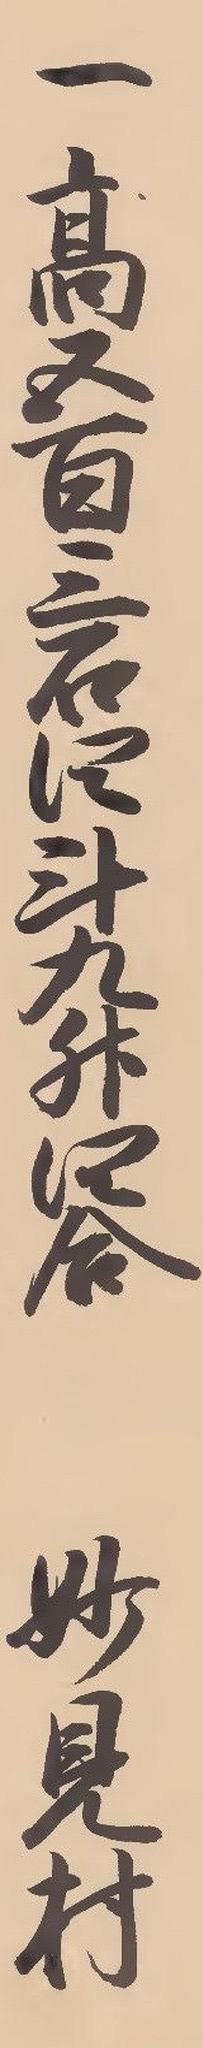一髙五百三石四斗九升四合妙見村
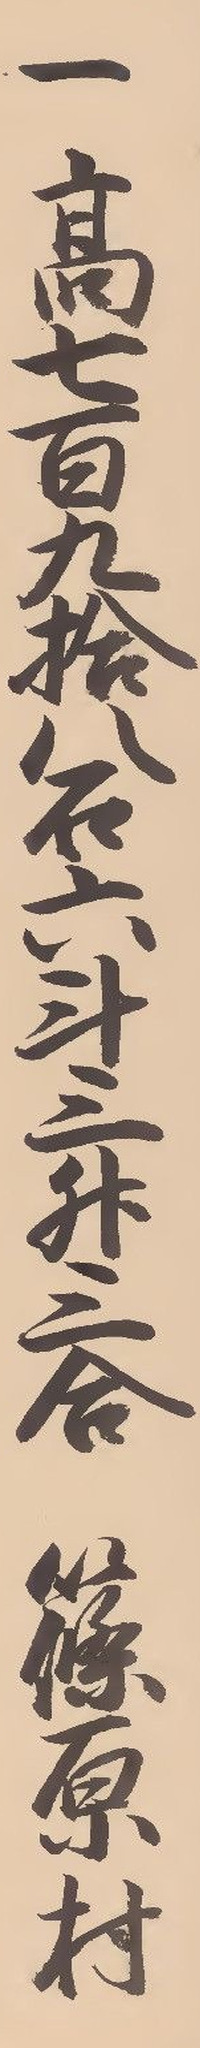一髙七百九拾八石六斗三升三合篠原村
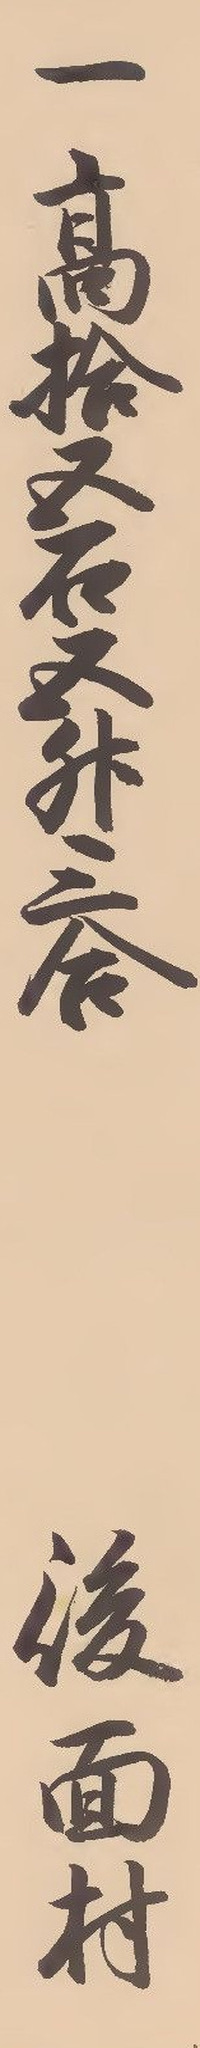一髙拾五石五升三合後面村
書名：土佐国郷帳
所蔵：国立公文書館 National Archives of Japan
